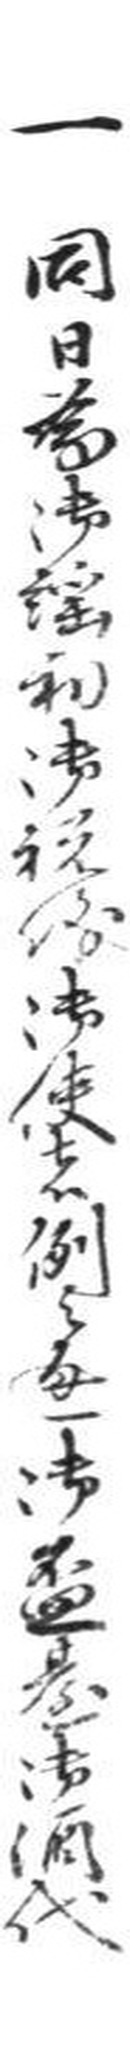一同日為御謡初御祝儀御使者例之通御盃台御酒代
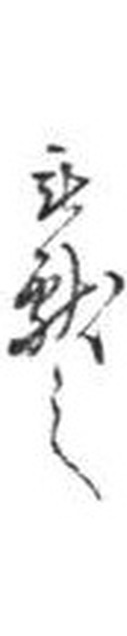被献之
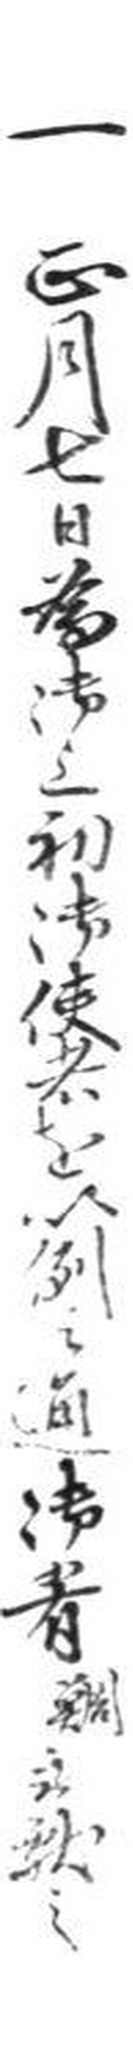一正月七日為御上初御使者を以例之通御肴鯛被献之
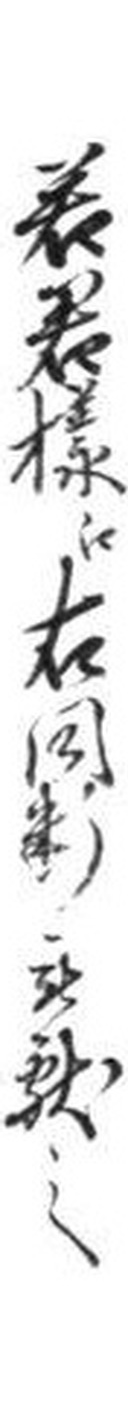若君様江右同断被献之
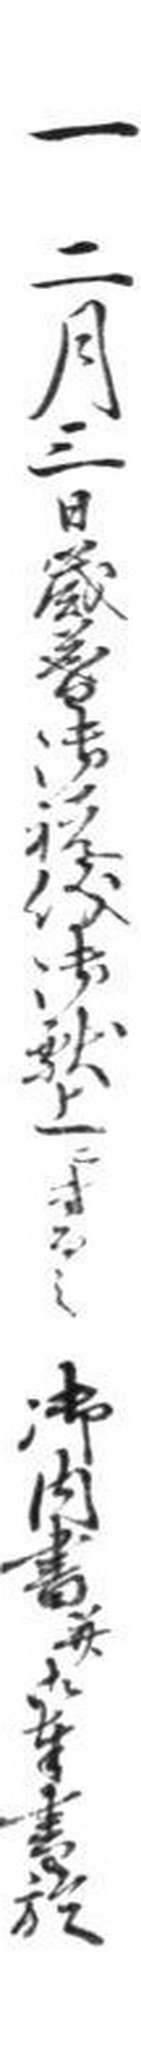一二月三日歳暮御祝儀御献上ニ付而之御内書并御奉書於
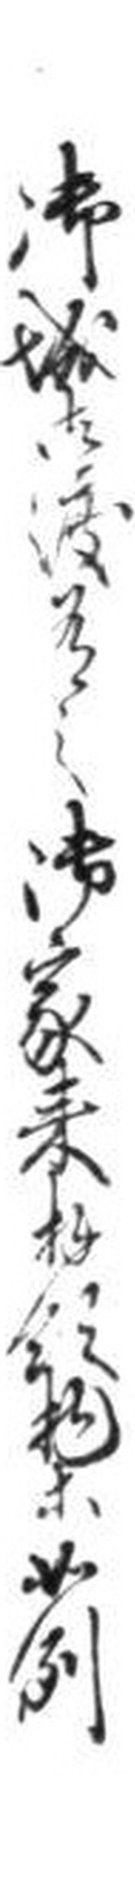御城御渡有之御家来拝領物等如例
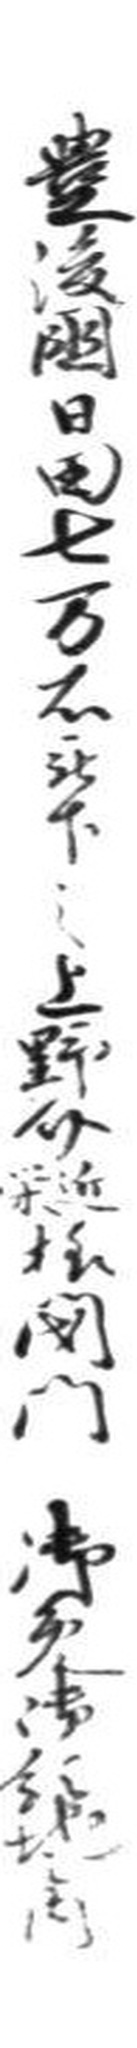豊後国日田七万石被下之上野介近栄様閉門御免御領地之内
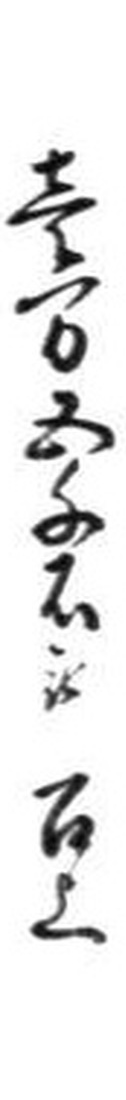壱万五千石被召上
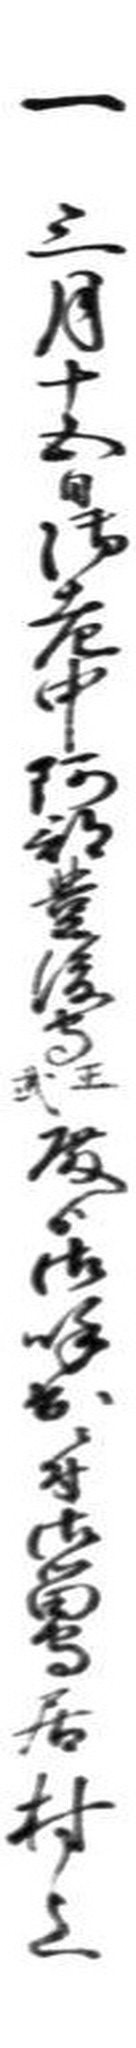一三月十五日御老中阿部豊後守正武殿ゟ御呼出ニ付御留守居村上
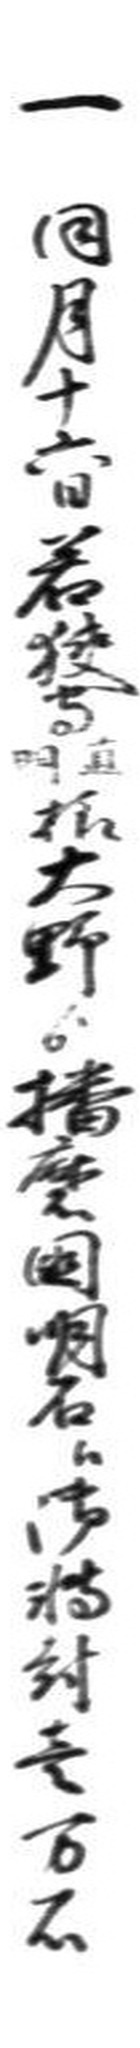一同月十六日若狭守直明様大野ゟ播磨国明石江御転封壱万石
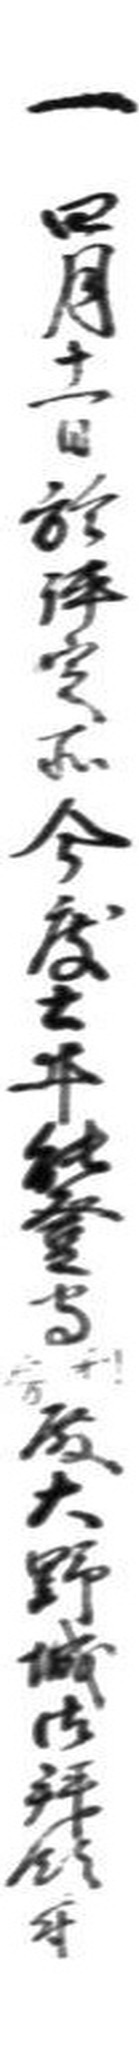一四月十一日於評定所今度土井能登守利房殿大野城御拝領ニ付
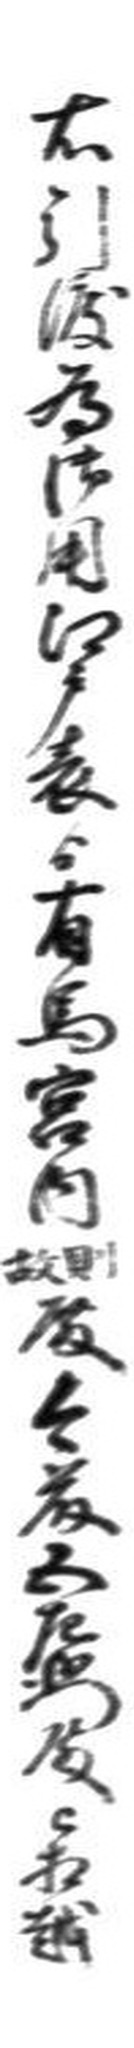右引渡為御用江戸表ゟ有馬宮内則故殿今藤五左衛門殿被相越
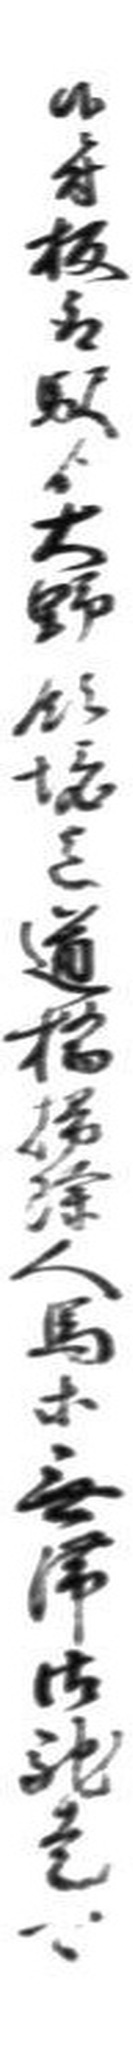候ニ付板取駅ゟ大野領境迄道橋掃除人馬等無滞御馳走可

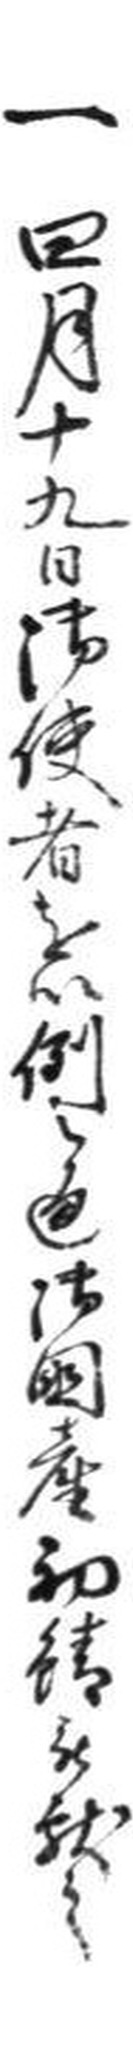一四月十九日御使者を以例之通御国産初鯖被献之
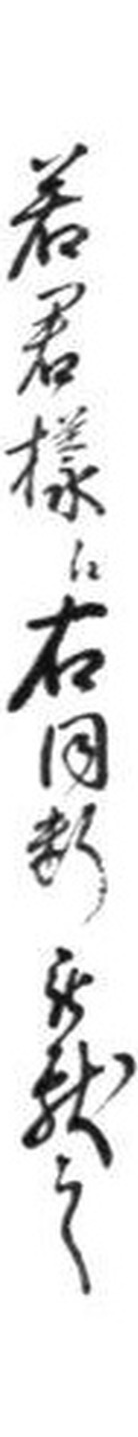若君様江右同断被献之
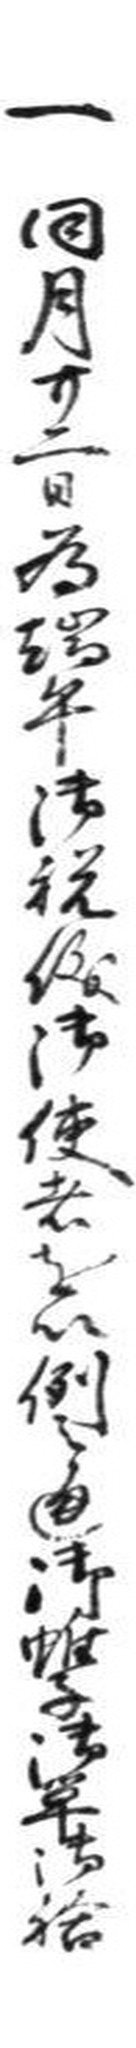一同月廿二日為端午御祝儀御使者を以例之通御帷子御単御袷
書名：家譜 十五 綱昌公 従天和元年到元禄十二年
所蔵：福井県文書館 Fukui Prefectural Archives
